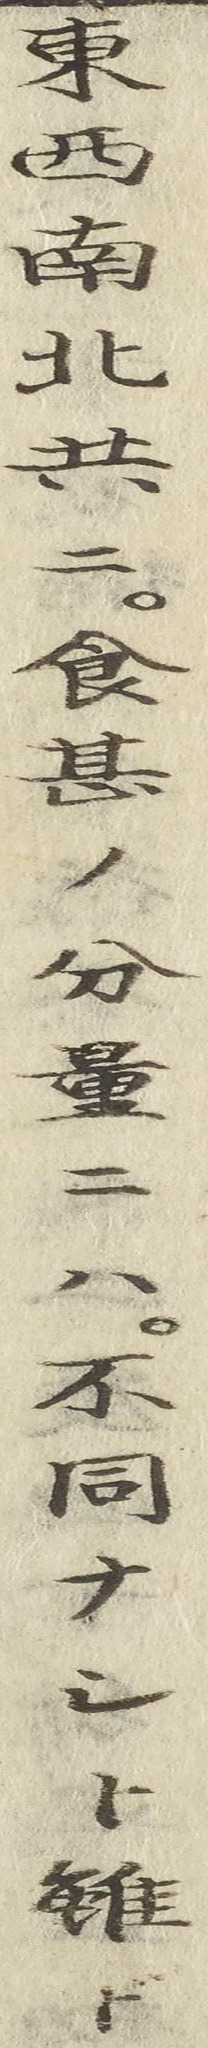東西南北共ニ。食甚ノ分量ニハ。不同ナシト雖ド
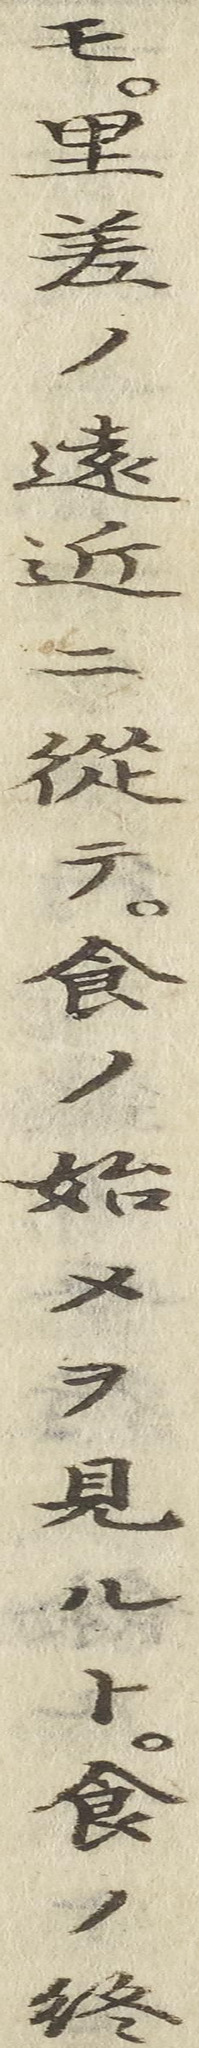モ。里差ノ遠近ニ従テ。食ノ始メヲ見ルト。食ノ終
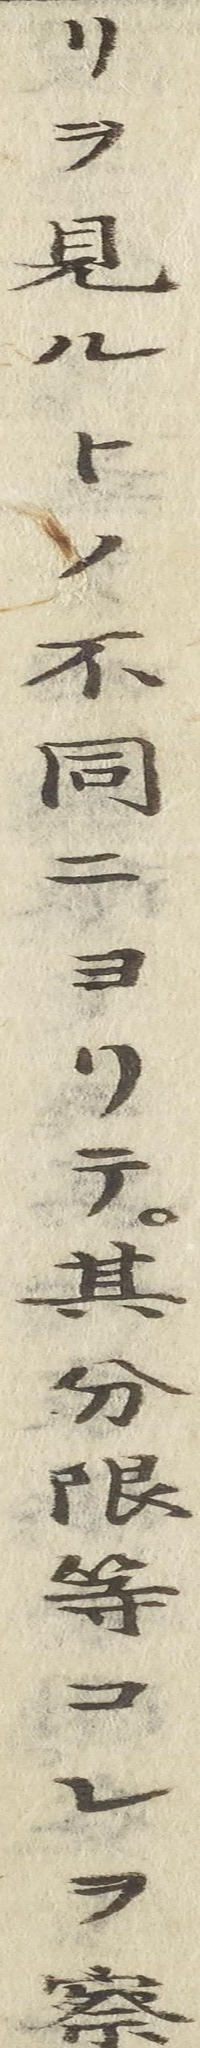リヲ見ルトノ不同ニヨリテ。其分限等コレヲ察
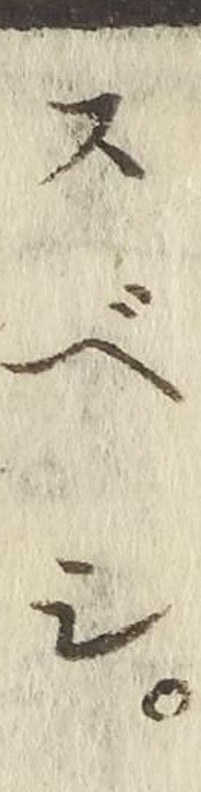スベシ。
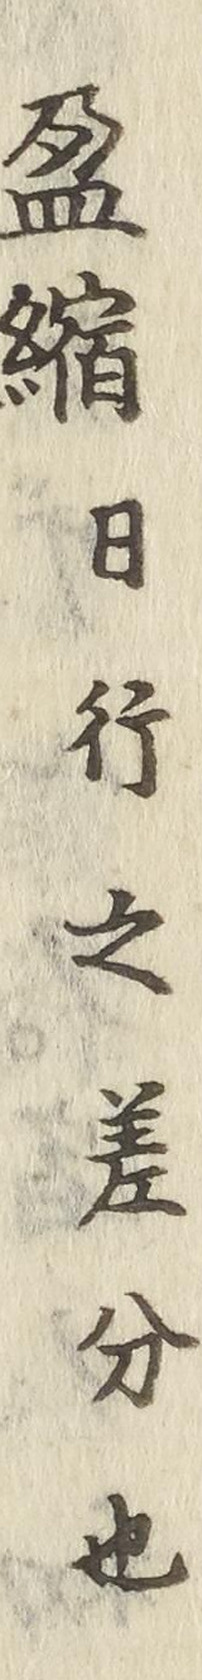盈縮日行之差分也
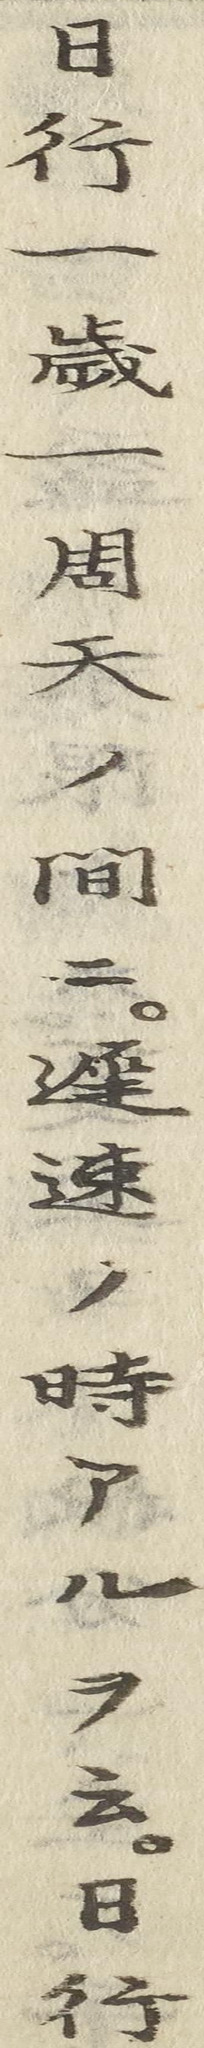日行一歳一周天ノ間ニ。遅速ノアルヲ云。日行
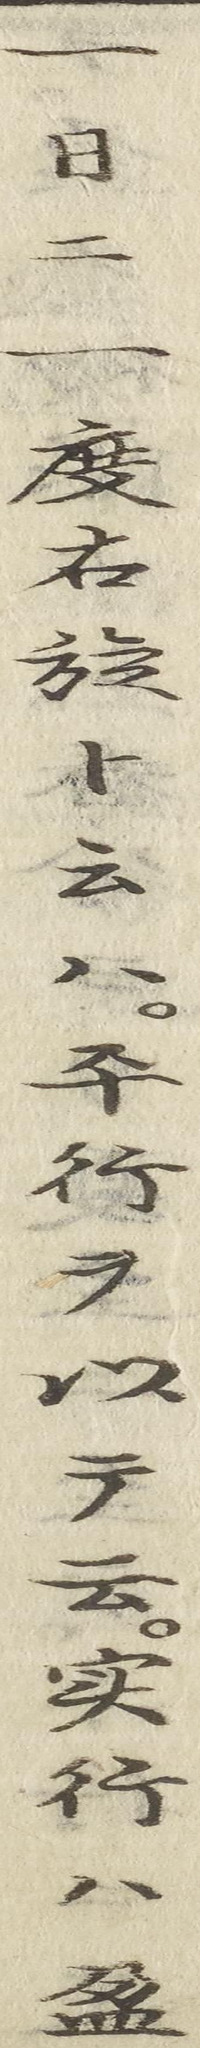一日ニ一度右旋ト云ハ。平行ヲ以テ云。実行ハ盈
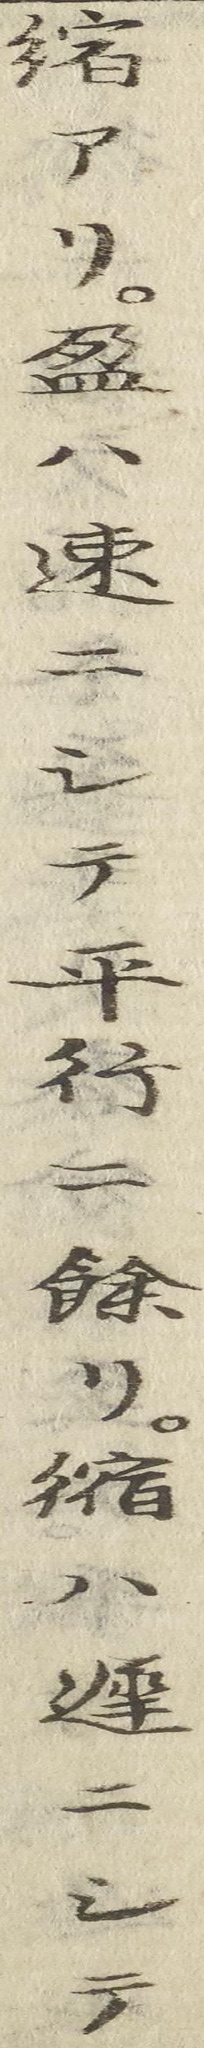縮アリ。盈ハ速ニシテ平行ニ余リ。縮ハ遅ニシテ

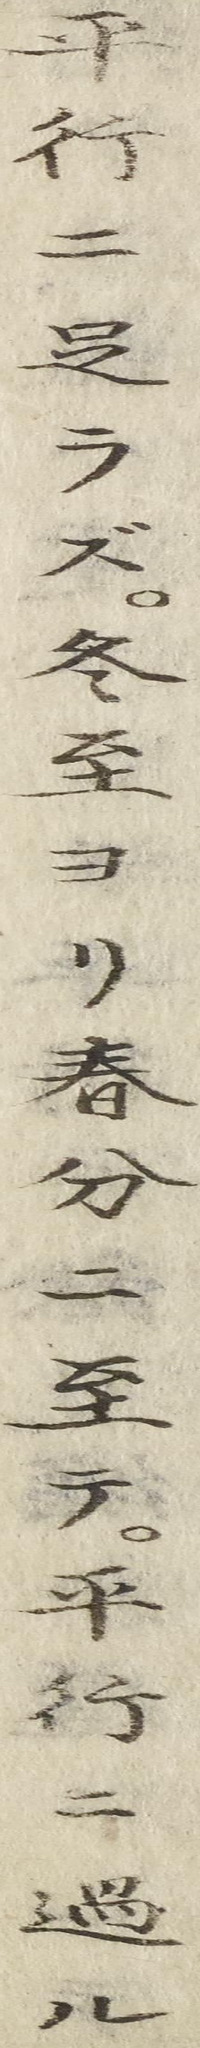平行ニ足ラズ。冬至ヨリ春分ニ至テ。平行ニ過ル
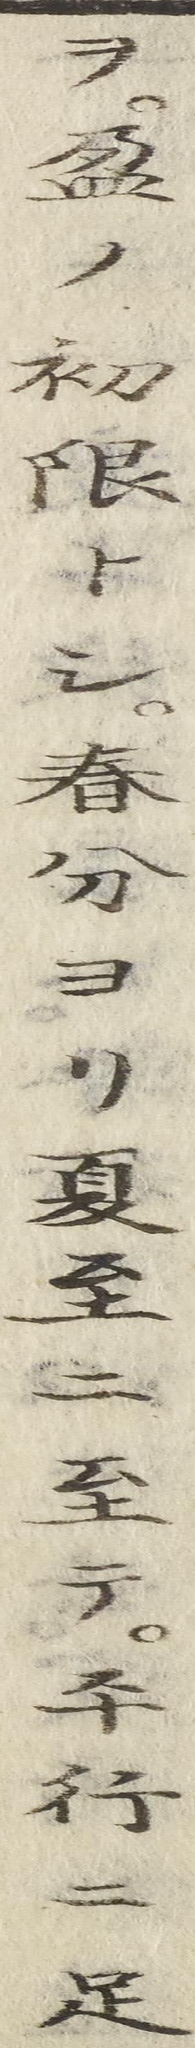ヲ。盈ノ初限トシ。春分ヨリ夏至ニ至テ。平行ニ足
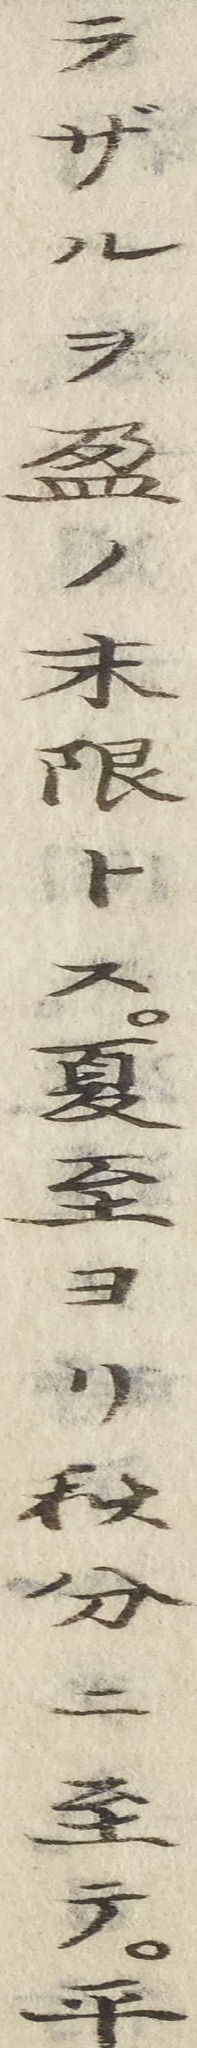ラザルヲ盈ノ末限トス。夏至ヨリ秋分ニ至テ。平
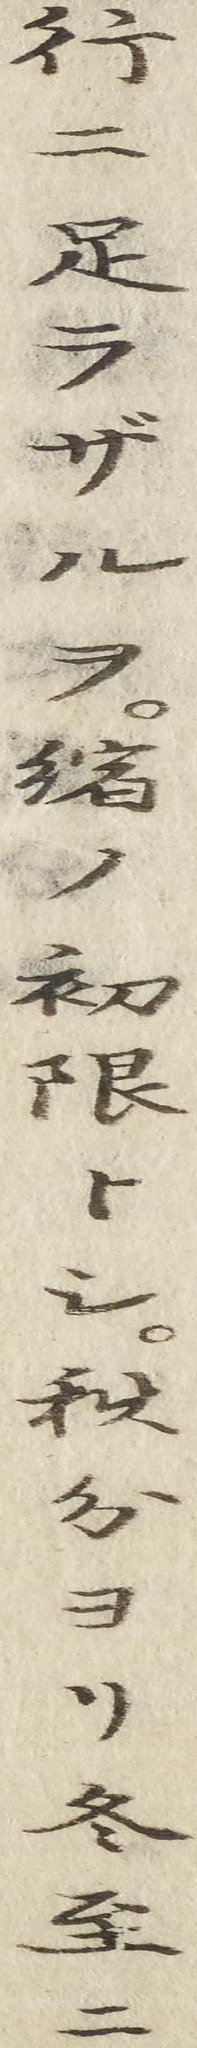行ニ足ラザルヲ。縮ノ初限トシ。秋分ヨリ冬至ニ
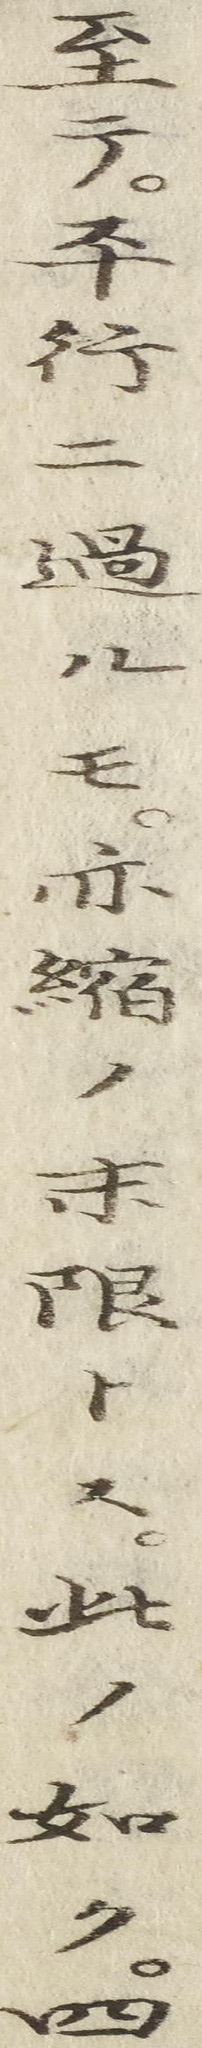至テ。平行ニ過ルモ。亦縮ノ末限トス。此ノ如ク。四
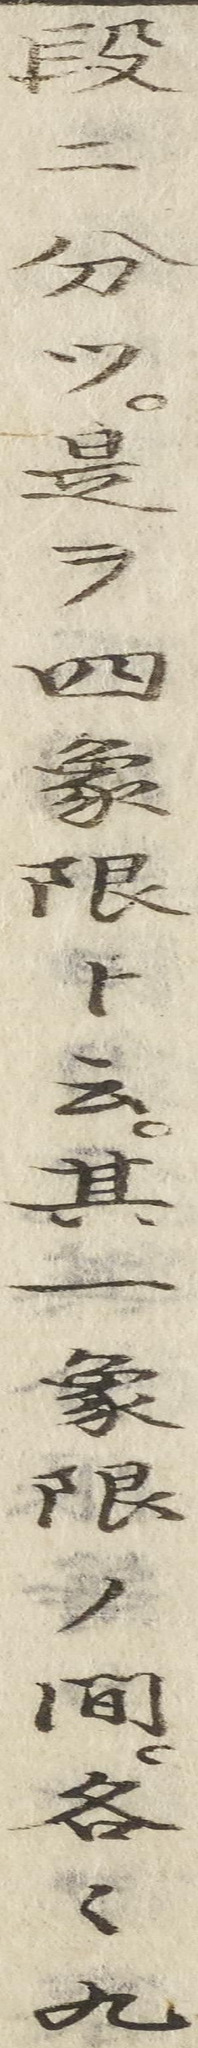段ニ分ツ。是ヲ四象限ト云。其一象限ノ間。各々九
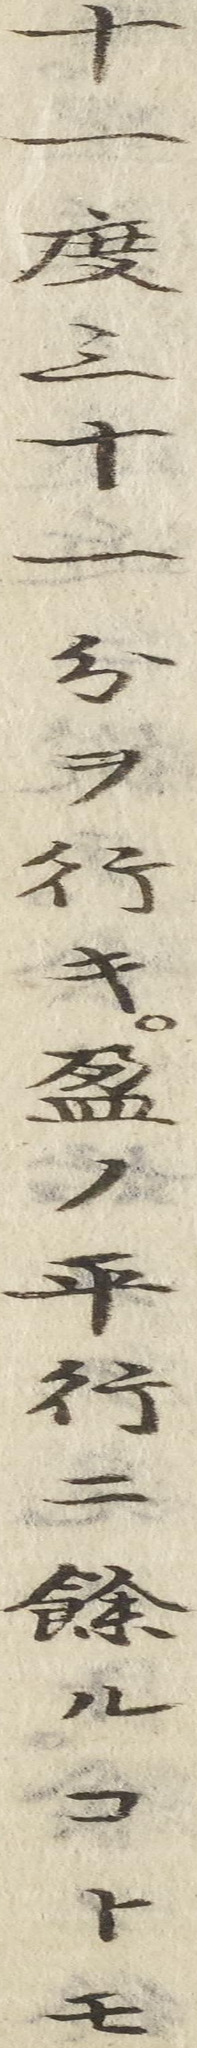十一度三十一分ヲ行キ。盈ノ平行ニ余ルコトモ
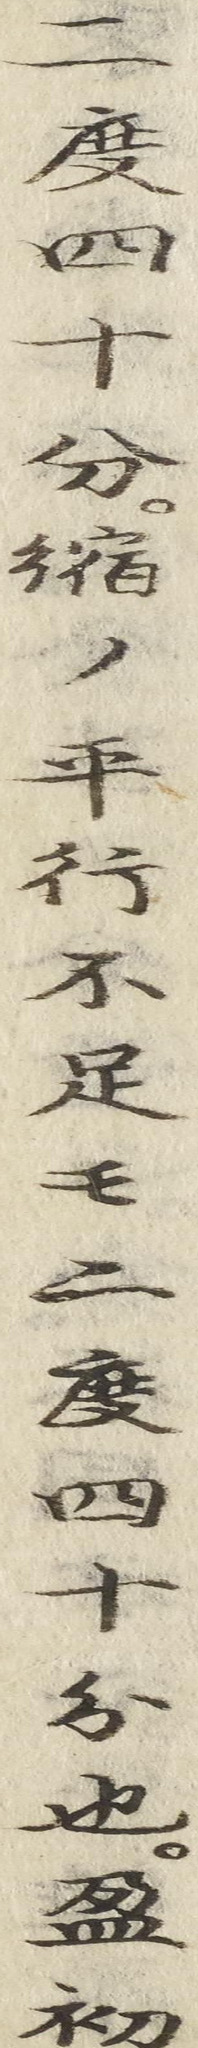ニ度四十分。縮ノ平行不足モ二度四十分也。盈初
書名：大略天学名目鈔　天經或問附録
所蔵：東京大学地震研究所図書室 Earthquake Research Institute Library, The University of Tokyo, JAPAN
